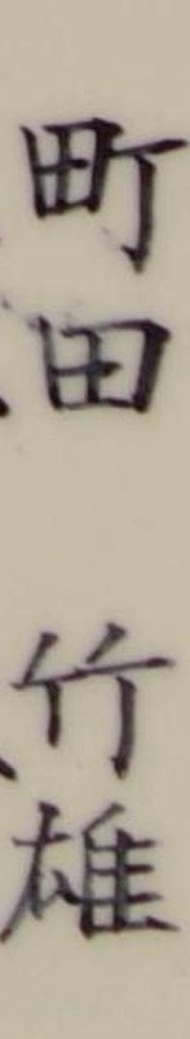町田竹雄
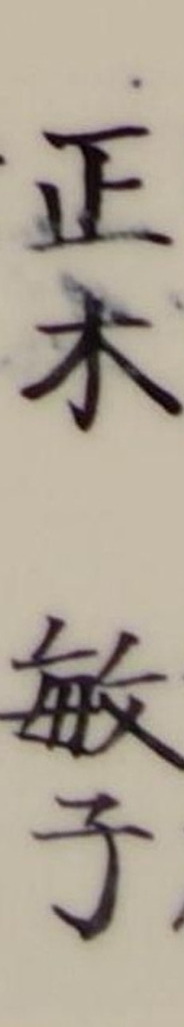正木敏子
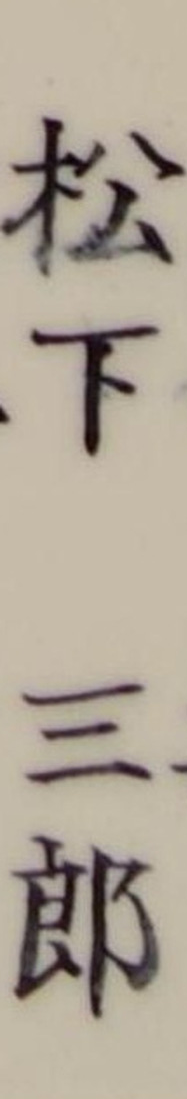松下三郎
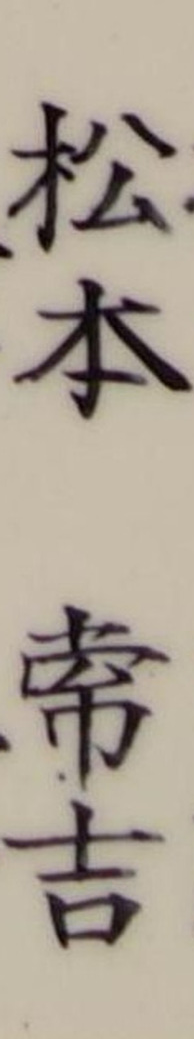松本常吉
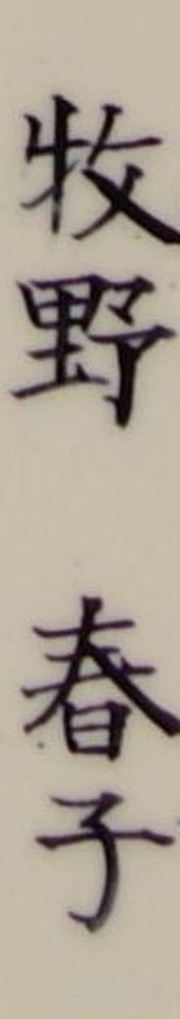牧野春子
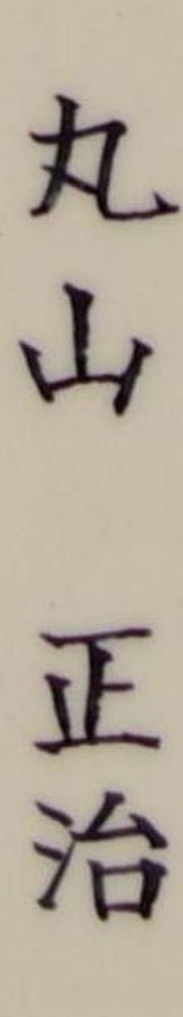丸山正治
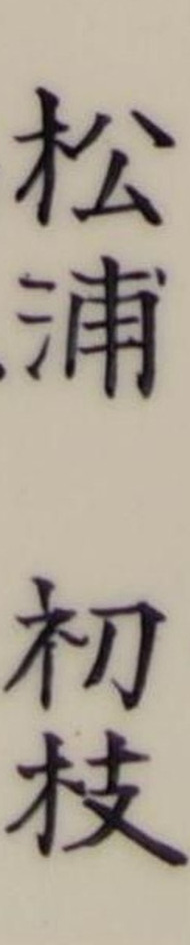松浦初枝
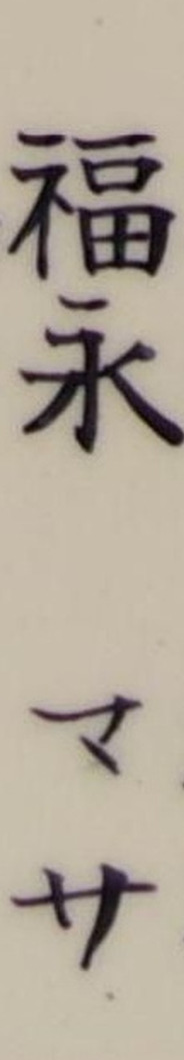福永マサ
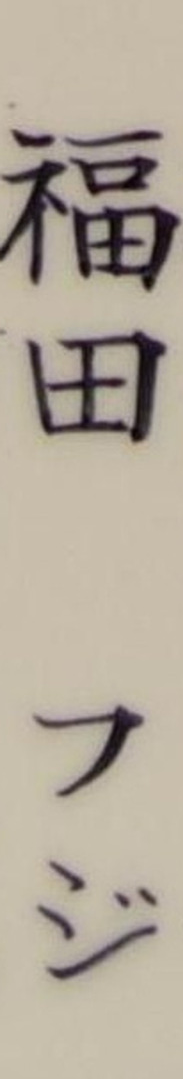福田フジ
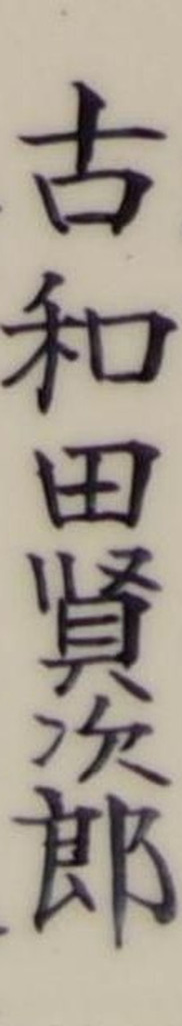古和田賢次郎
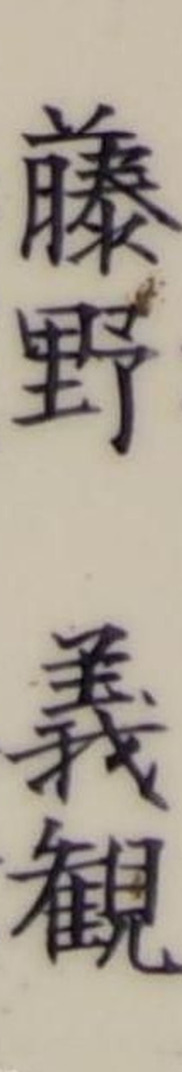藤野義観
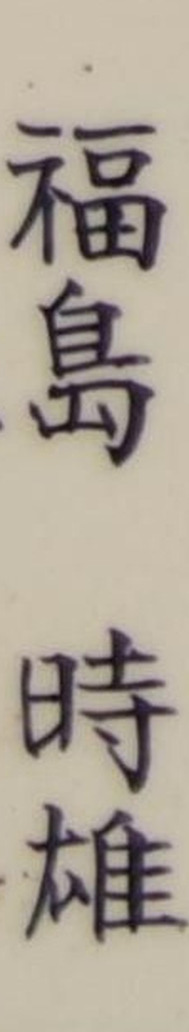福島時雄
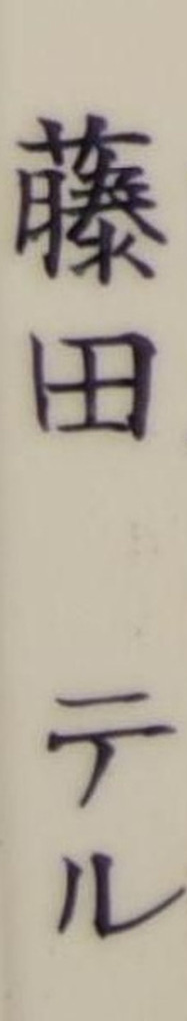藤田テル

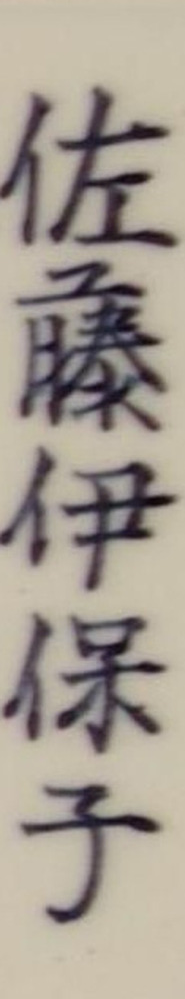佐藤伊保子
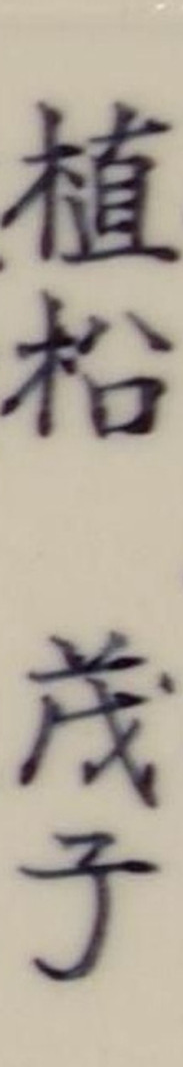植松茂子
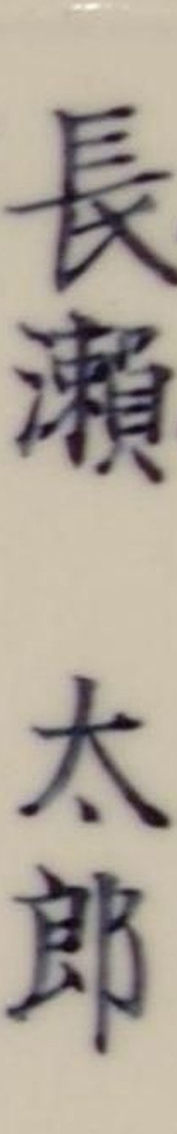長瀬太郎
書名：M~S
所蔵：高野山金剛峯寺
